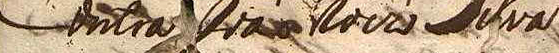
Contra João Roiz̄ Silva
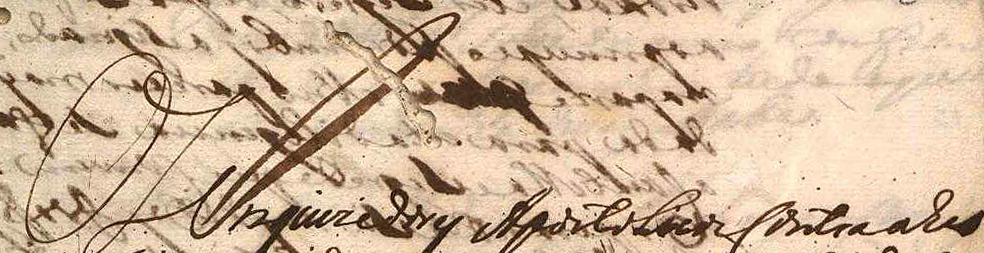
Os Inquizidores ApostoLicos Contra a he
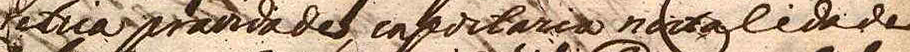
retica pravidade, e apostazia nesta cidade
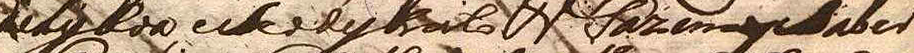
de Lisboa, e seo districto &a Fazemos Saber
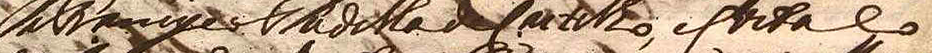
a Francisco Tudella de Castilho, e Costa co
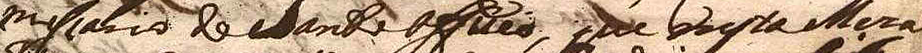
missario de Santo officio, que nesta Meza
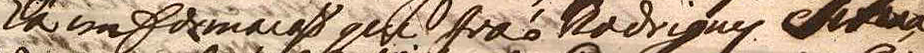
há imformaçaõ que Joaõ Rodrigues Silua,
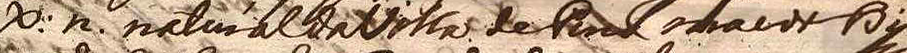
x: n. natural da Villa de Penamacor Bis
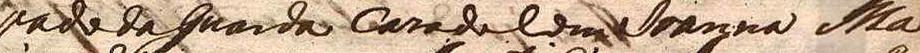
pado da Guarda Cazado com Ioanna Ma
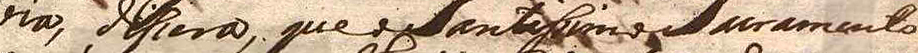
ria, dissera, que o Santissimo Sacramento
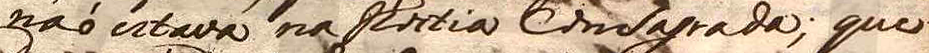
naõ estava na Hostia Consagrada; que
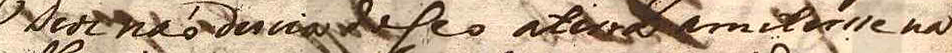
Deos naõ descia do Ceo a terra a metersse na
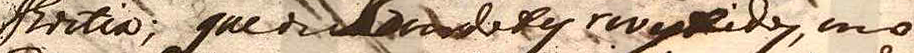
Hostia; que os Sacerdotes revestidos, e no
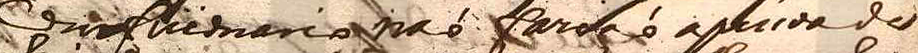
comficionario naõ faziaõ a pessoa de
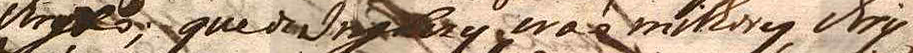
christo; que os Inglezes eraõ milhores, chris
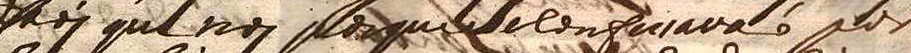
taõs que nos porque Se confessavaõ por
